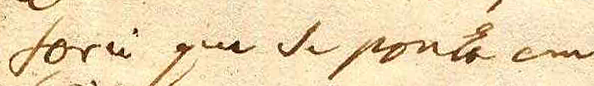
farei que se ponha em
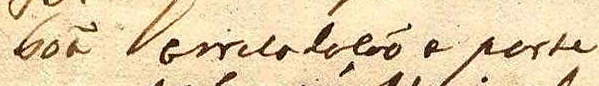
boã arrecadaçaõ a parte
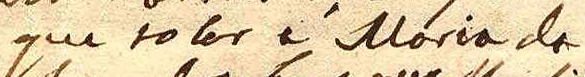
que toCar a Maria da
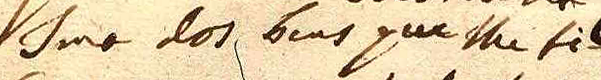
Ima dos bens que lhe fi
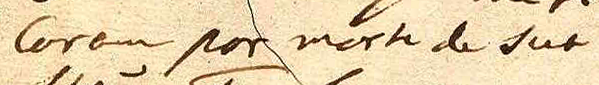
Caram por morte de sua
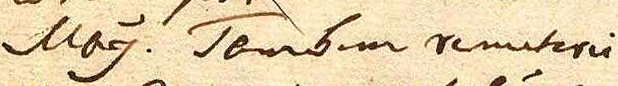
Maȳ. Tambem remeterei
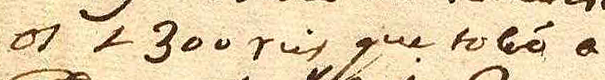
os 1300 reis que tocaõ a
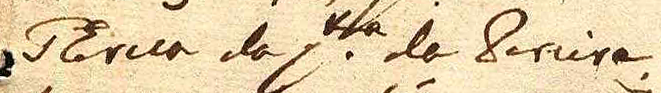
Thereza da q.ta da Pereira
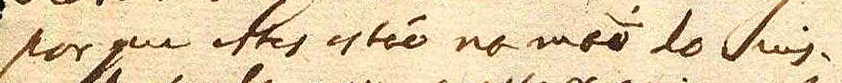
porque estes estaõ na maõ do Iuis
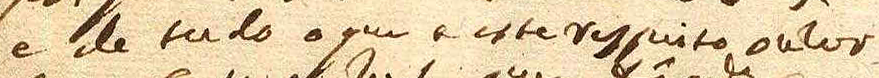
e de tudo o que a este respeito ouver
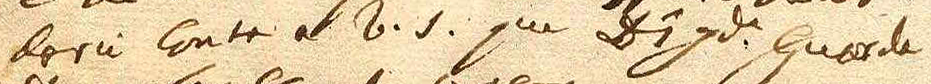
darei conta a V. s. que Ds̄ gd.e Guarda
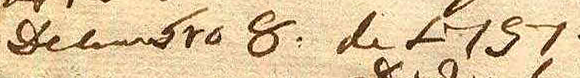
Decembro 8. de 1757.
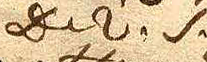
De V. s.
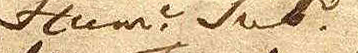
Hum.e sub.o
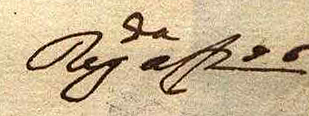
Regda a f 96
